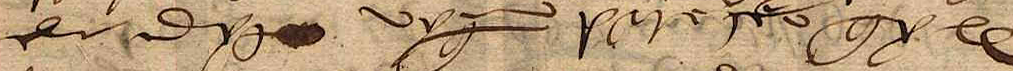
ele dyto vygro pareceo gyll
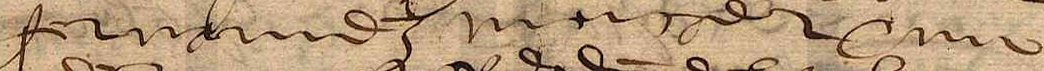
fernamdez mercador e mo
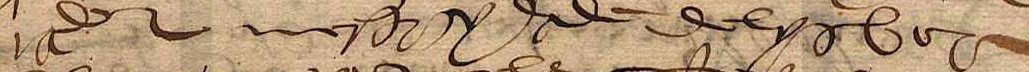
rador nesta cydade de lysboa
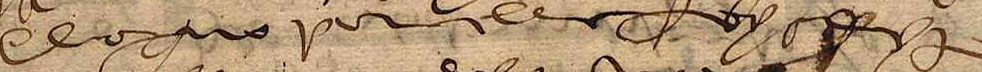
e loguo por elle foy a dyto
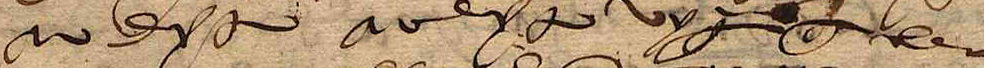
ao dyto ao dyto vygro q̄ elle
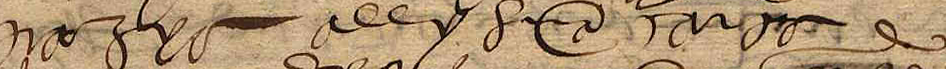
trazya ally huā carta do
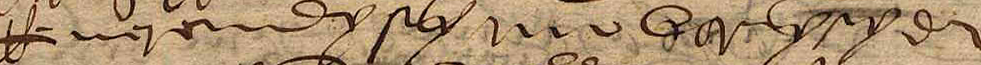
Reuerendysymo ēquysydor
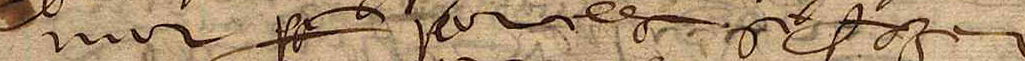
mor ꝑa por ella se fazer
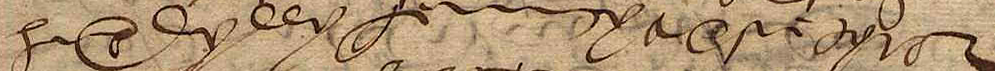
huā dyllygemcya e se tyrar
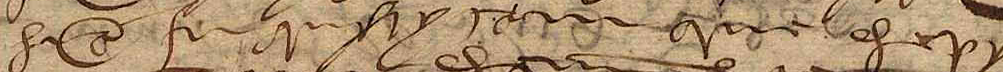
huā Jnquyrycam que lhe py
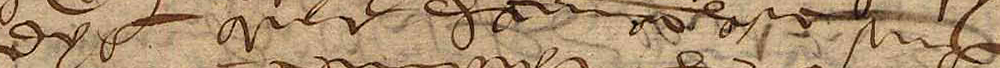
dya que lha mãodase sua
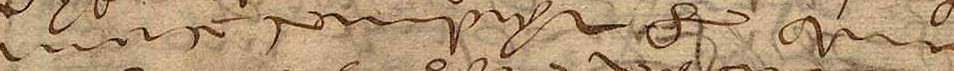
merce compryr ho que
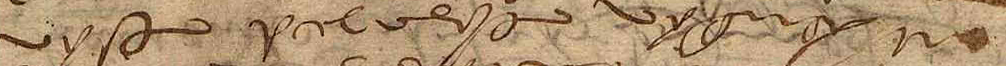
vysto pelo dyto vyguayro
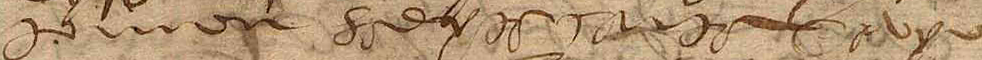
tomou ha dyta carta e a vyo
